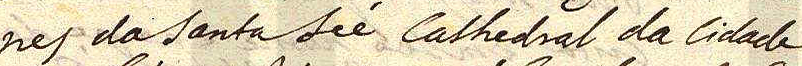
nes da Santa Seé Cathedral da Cidade
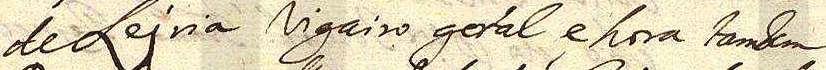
de Lejria vigairo geral e hora tambem
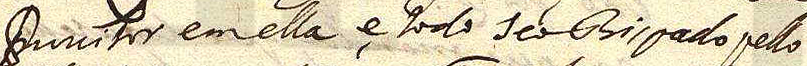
Prouisor em ella e, todo seo Bispado pello
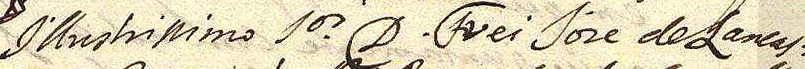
Illustrissimo sor. D. Frei Joze de Lancas
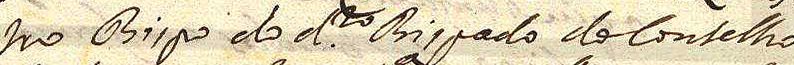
tro Bispo do d.to Bispado do Conselho
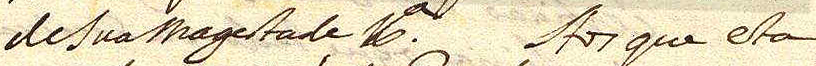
de Sua Magestade &a. Aos que esta
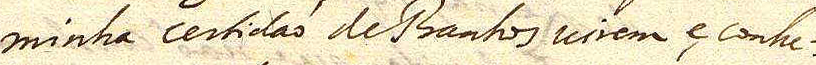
minha certidaõ de Banhos uirem e, conhe
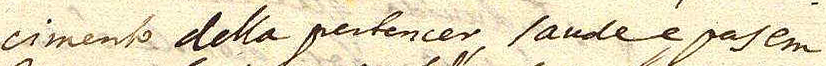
cimento della pertencer saude, e pas em
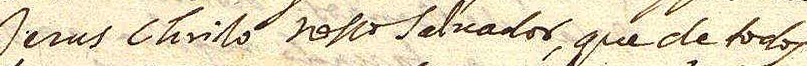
Jezus Christo nosso Saluador, que de todos
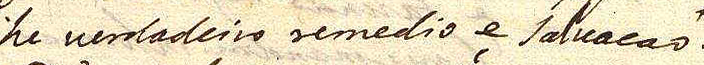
he uerdadeiro remedio, e saluaçaõ.
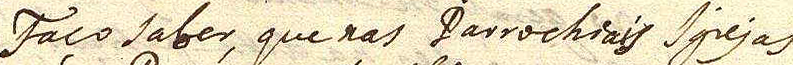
Faço saber, que nas Parrochiais Igrejas
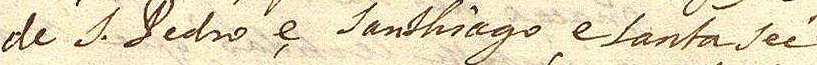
de S. Pedro, e Santhiago, e Santa Seé
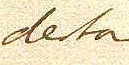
desta
